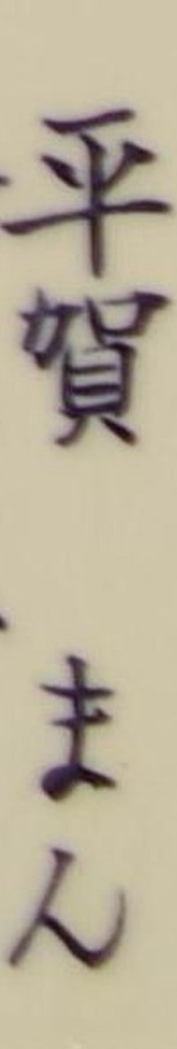平賀まん
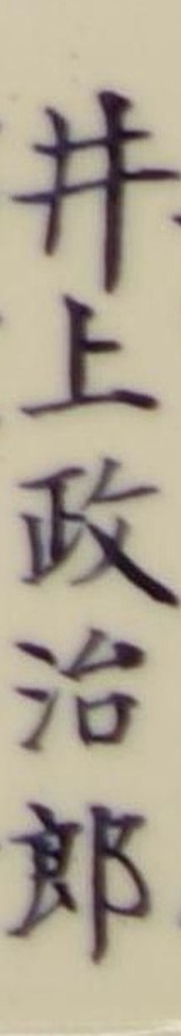井上政治郎
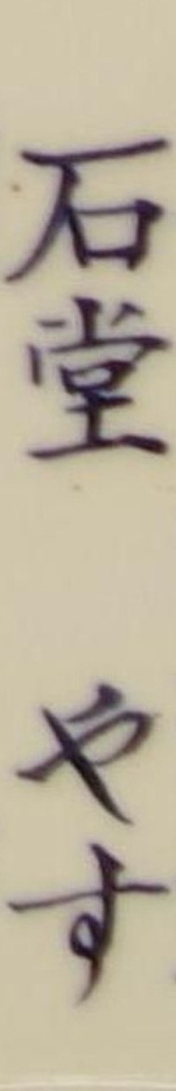石堂やす
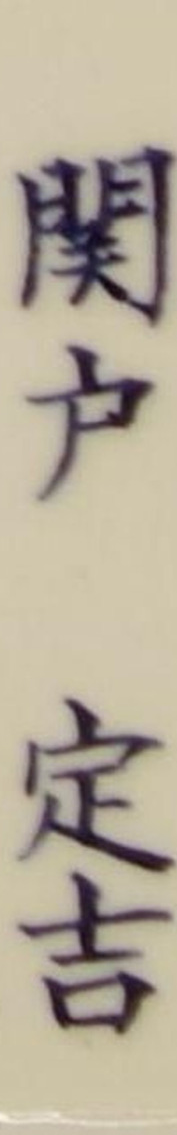関戸定吉
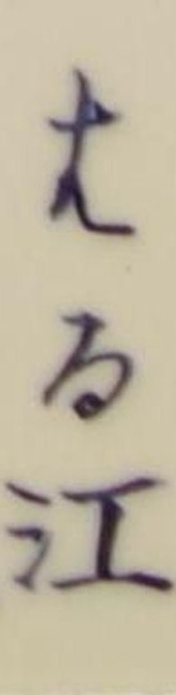はる江
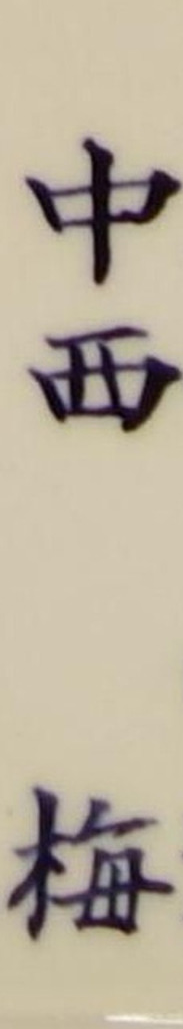中西梅
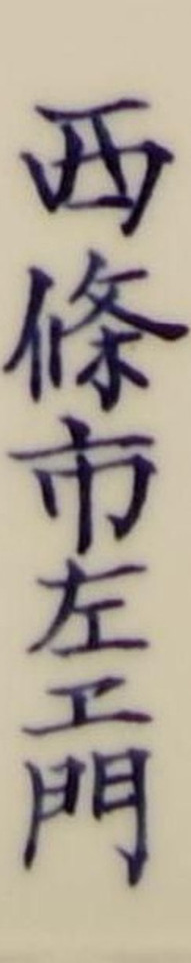西條市左エ門
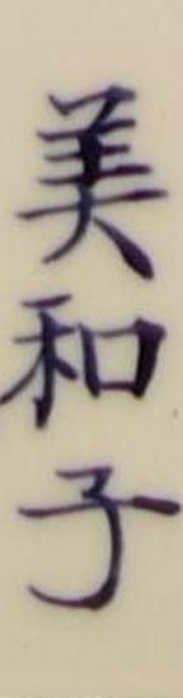美和子
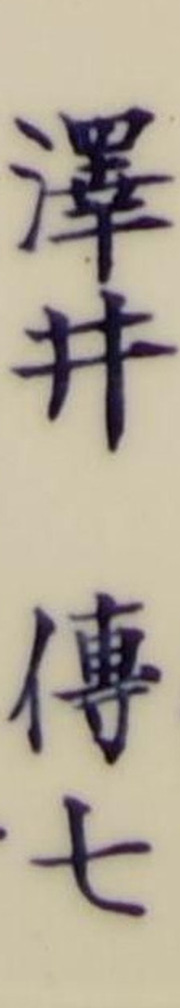澤井傳七
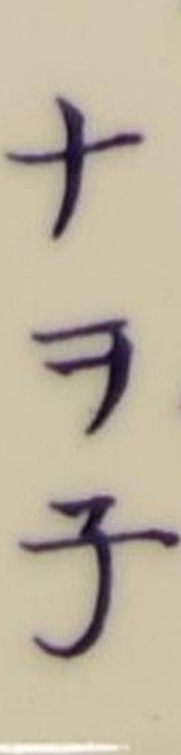ナヲ子
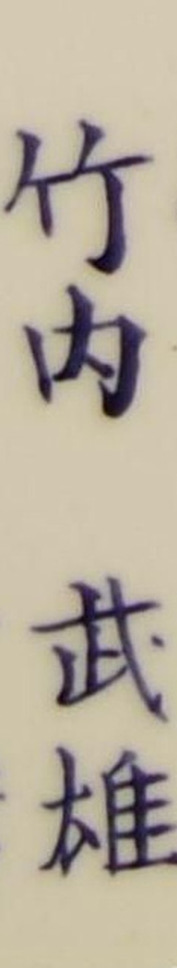竹内武雄
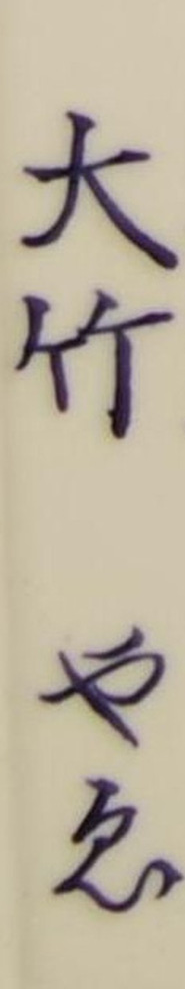大竹やゑ

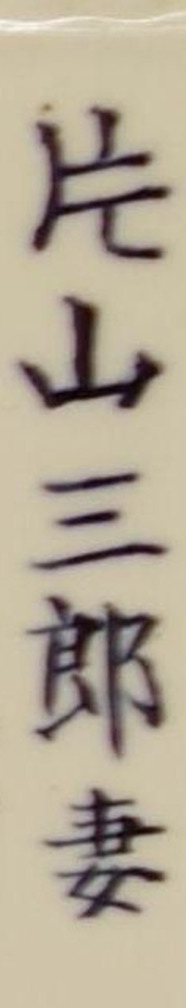片山三郎妻
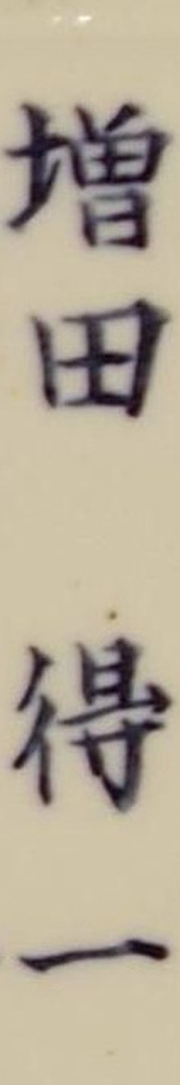増田得一
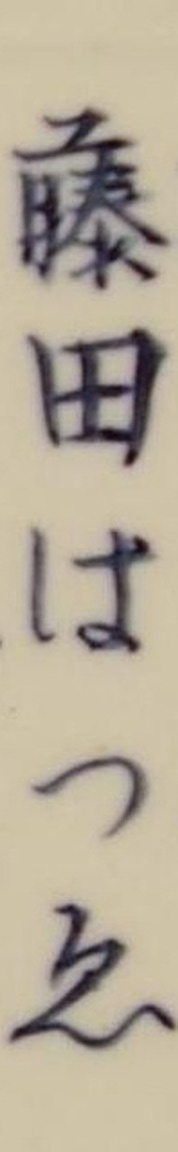藤田はつゑ
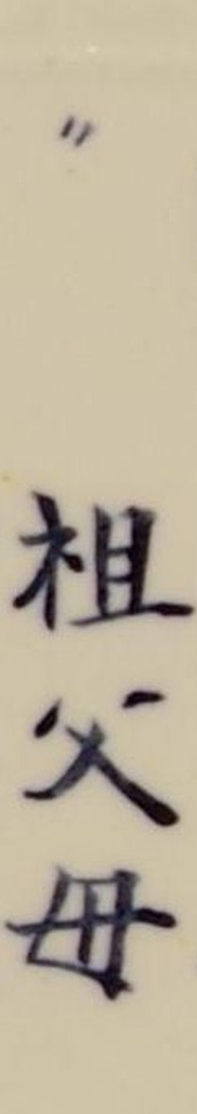祖父母
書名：E~L
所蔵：高野山金剛峯寺
